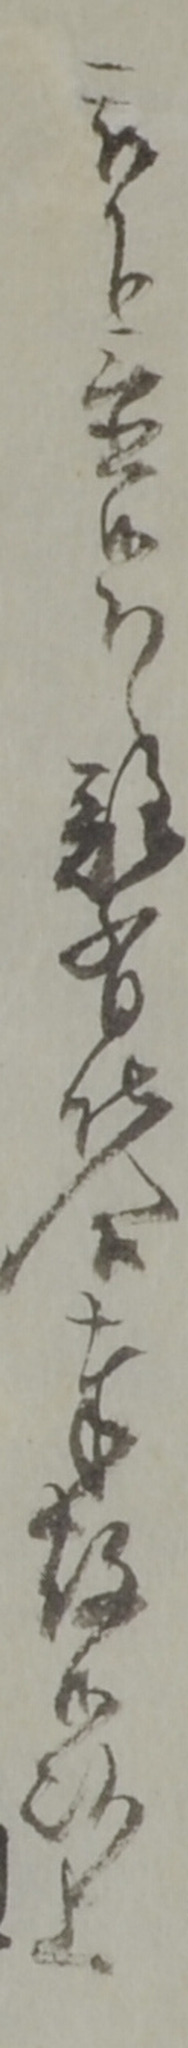被下置候ハヽ難有仕合奉存候以上
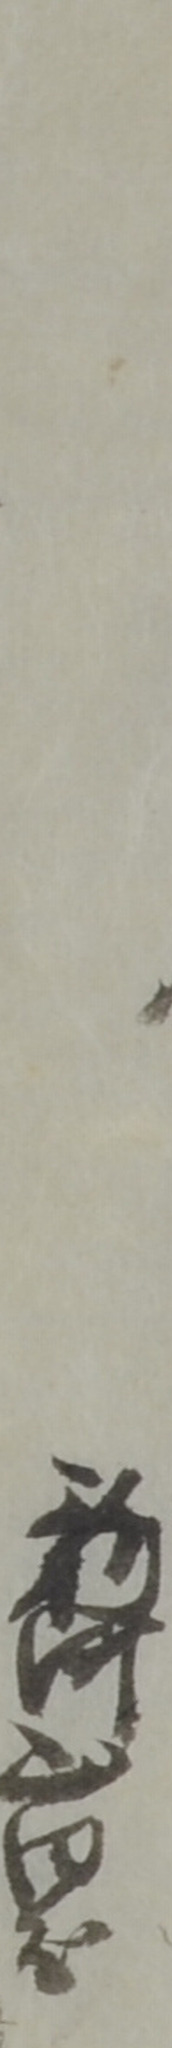新町山田屋
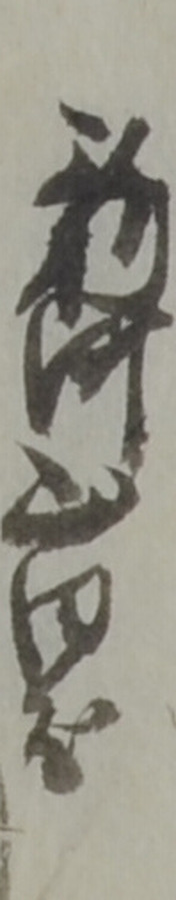新町山田屋
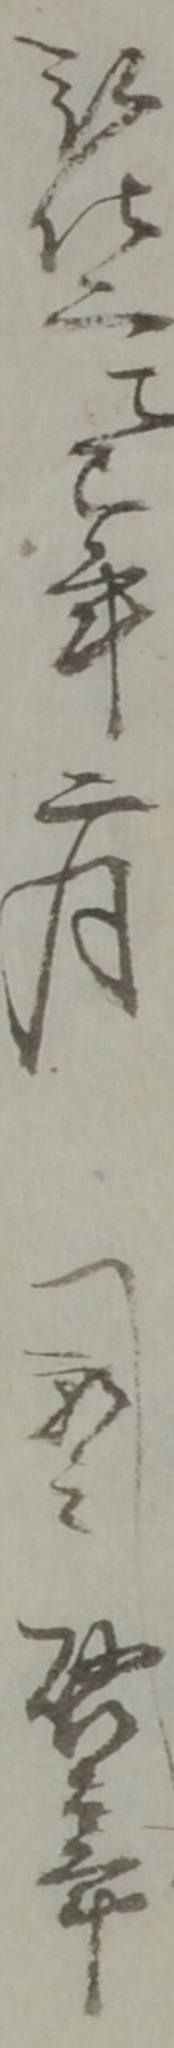弘化二乙巳年二月願主啓太郎
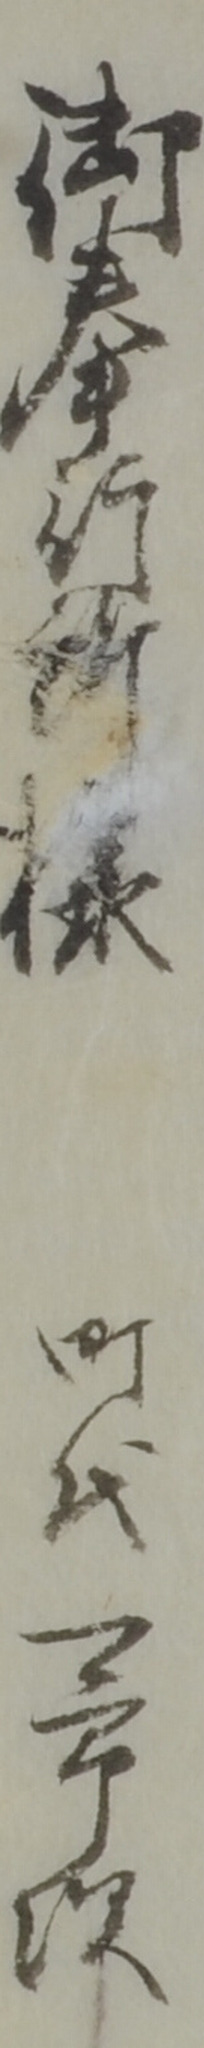御奉行所様町代一郎次
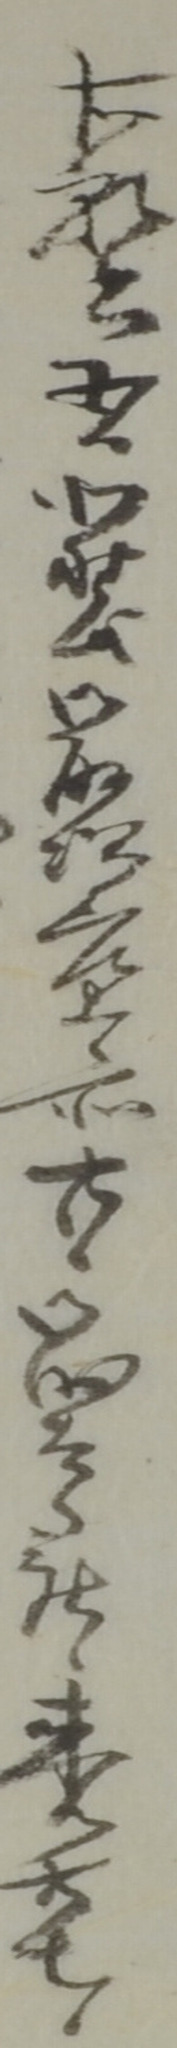右願書五日北野氏御取次差上候所廿日御沙汰御座候来ル廿七日
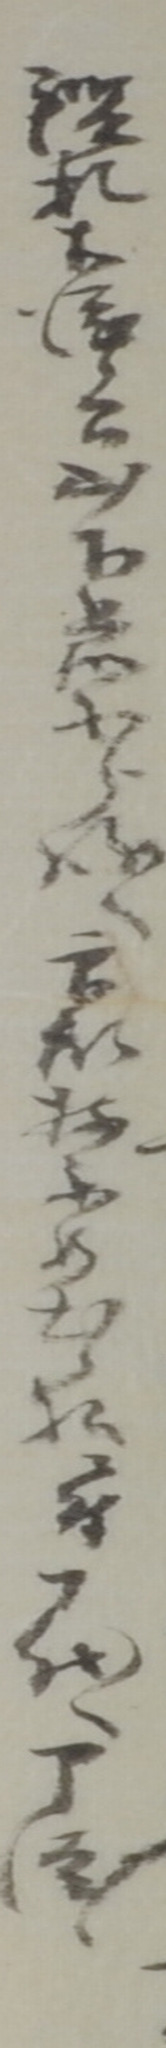鑑札相渡候ニ而被下置候北野様へ印形持参罷出候様ニ付丁代へ申渡候
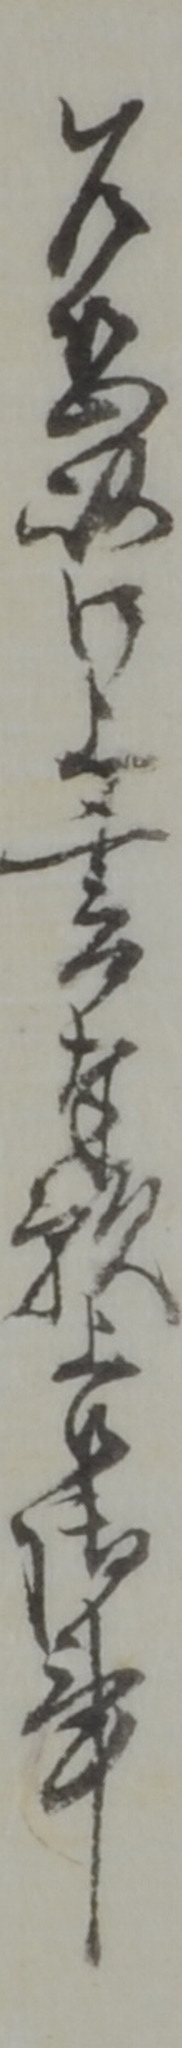乍恐以口上書奉願上候御事
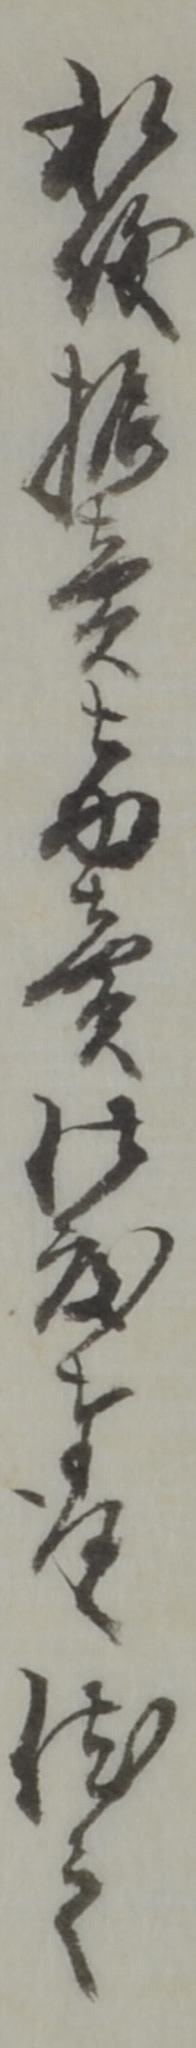私儀振売商売此度奉存候依之
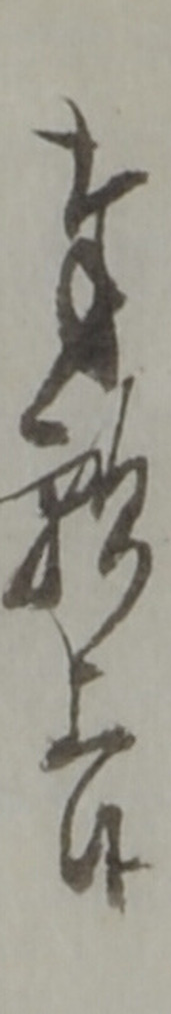奉願上候
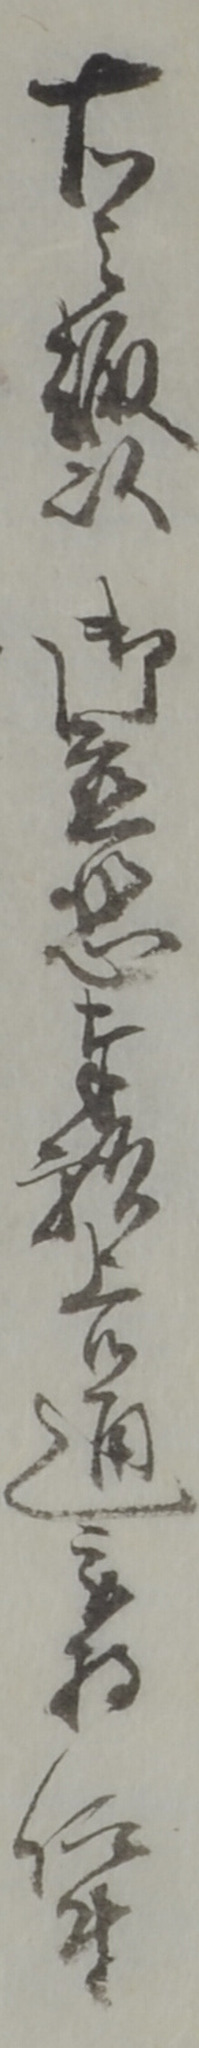右之趣以御慈悲奉願上候通被為仰付
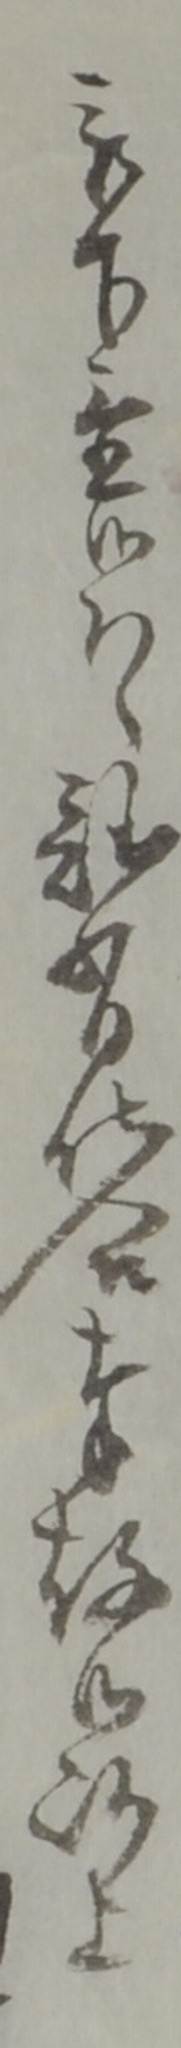被下置候ハヽ難有仕合奉存候以上
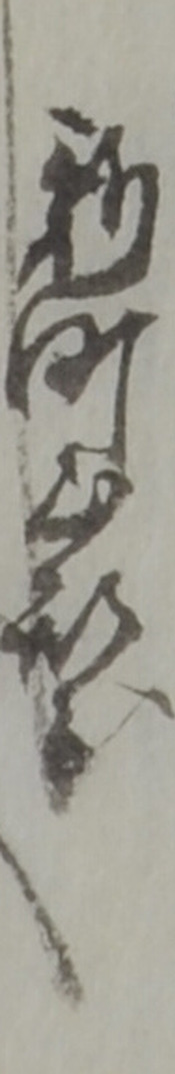新町山田屋
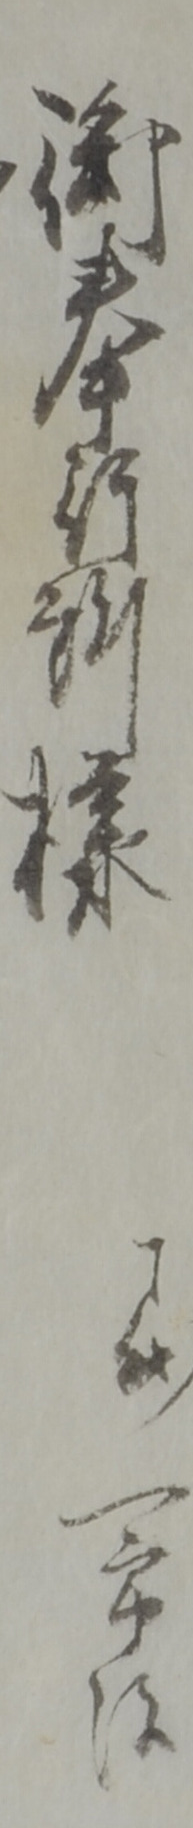御奉行所様町代一郎次
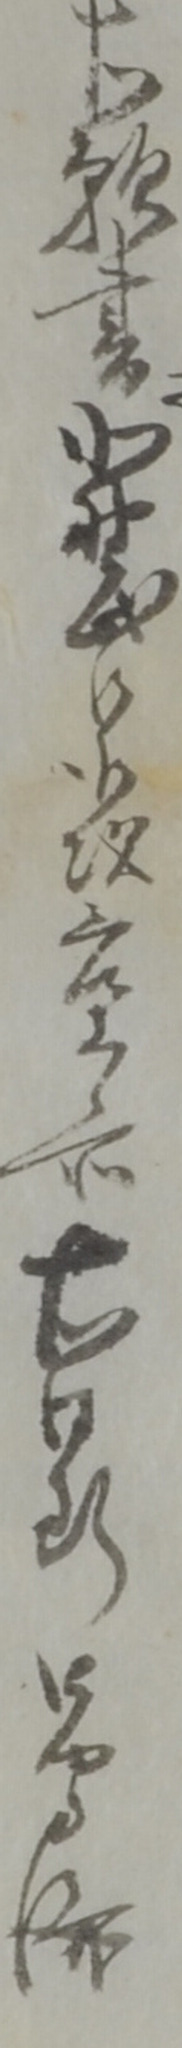右願書北野氏御取次差上候所右同断御聞済

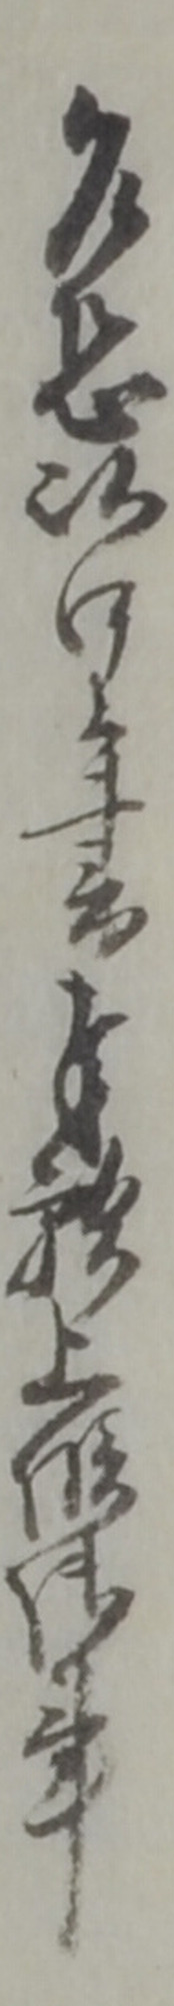乍恐以口上書奉願上候御事
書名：諸願書控簿
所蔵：伊那市立高遠町図書館・合同会社AMANE
